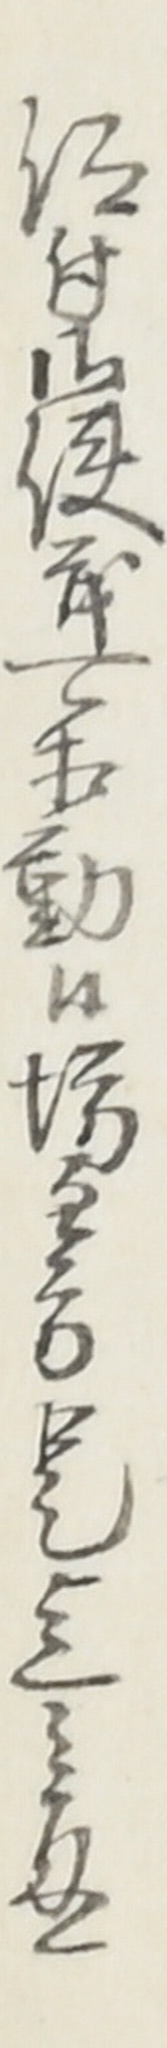仰付御使茂可相勤候坊主方是迄之通
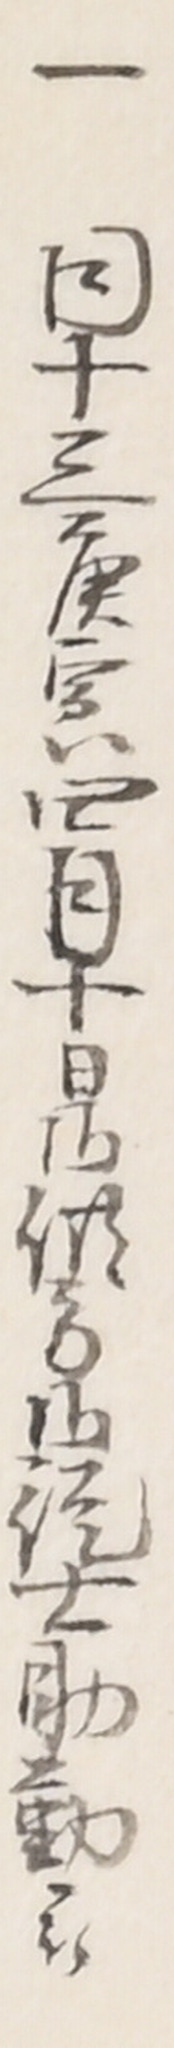一同十三庚寅四月十日御供方御徒士助勤被
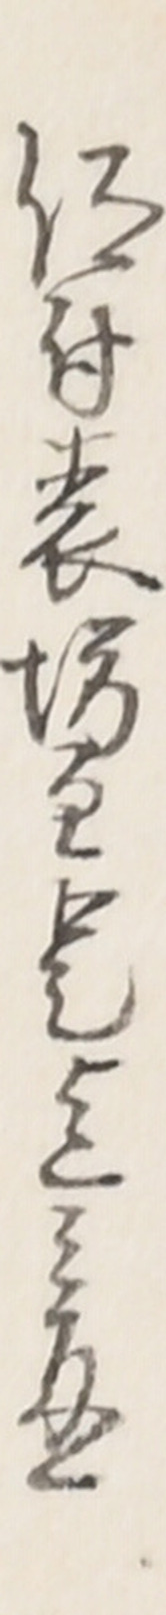仰付表坊主是迄之通
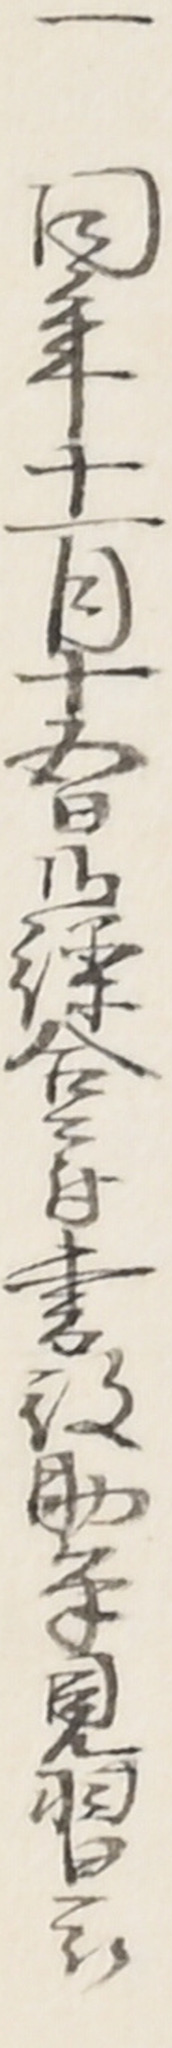一同年十一月十五日繰合ニ付書役助筆見習被
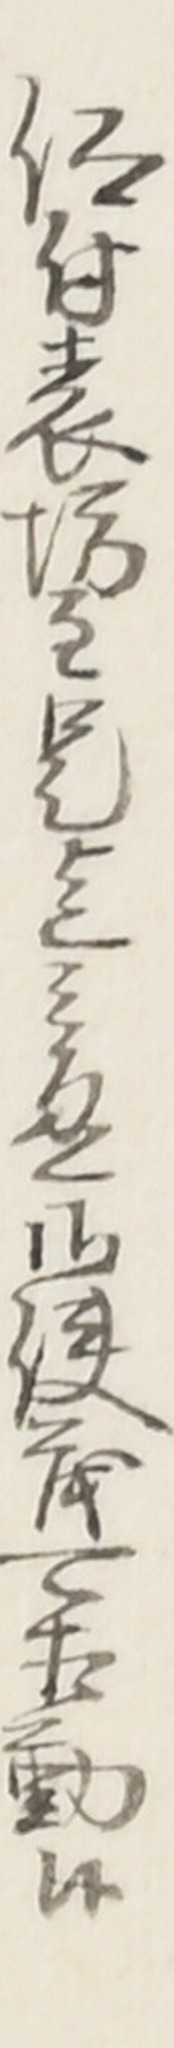仰付表坊主是迄之通御使茂可相勤候
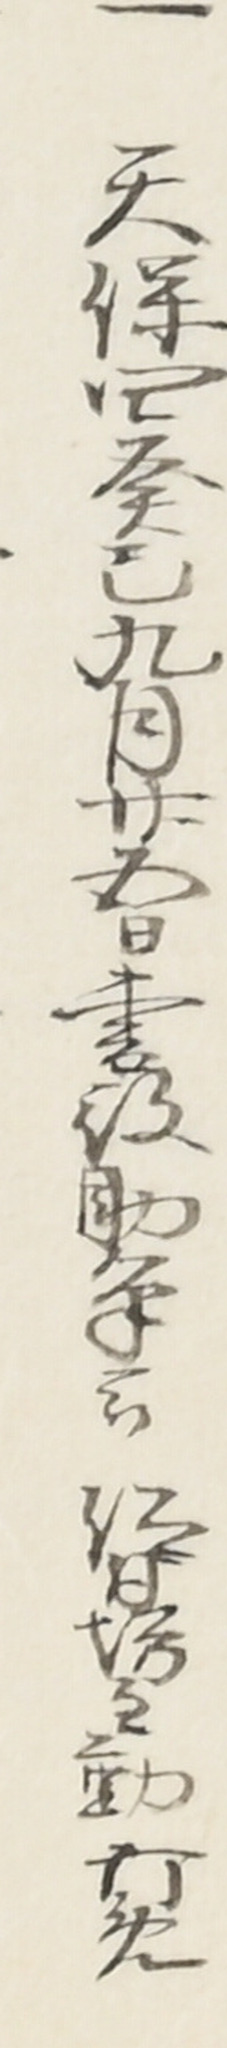一天保四癸巳九月廿五日書役助筆被仰付坊主勤御免
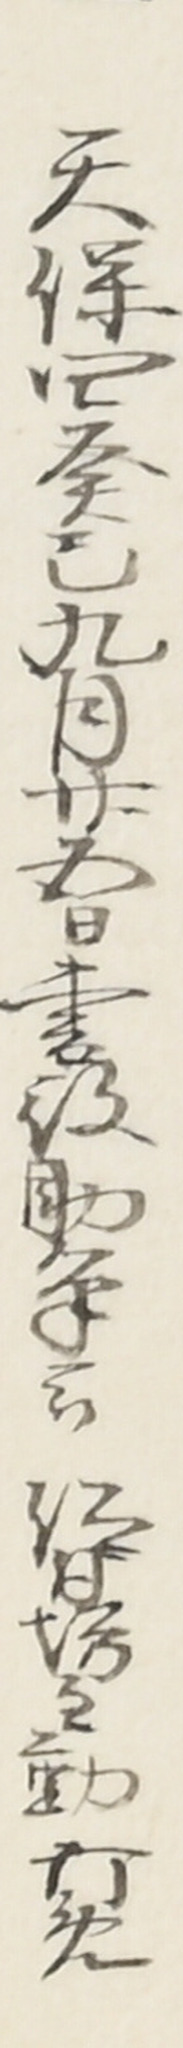一天保四癸巳九月廿五日書役助筆被仰付坊主勤御免
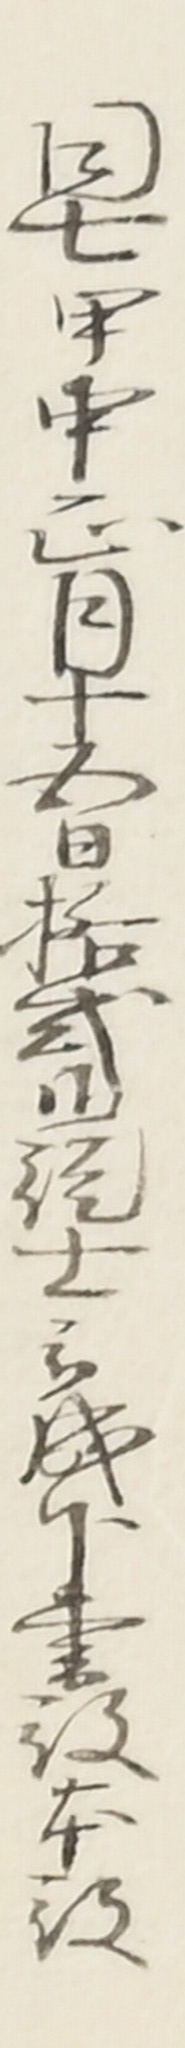一同七甲申正月十五日格式御徒士被成下書役本役
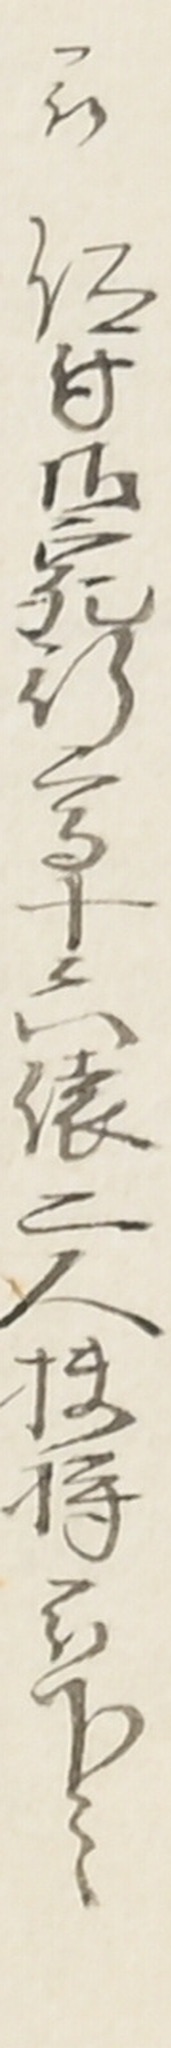被仰付御宛行高十六俵二人扶持被下之
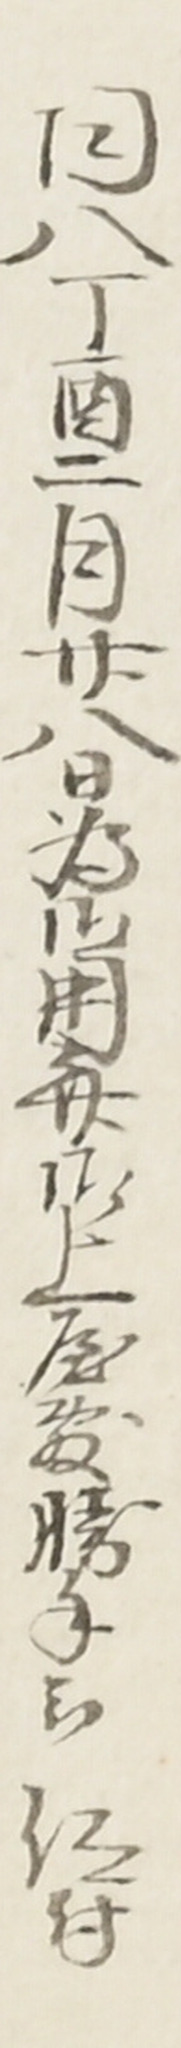一同八丁酉二月廿八日為御用弁御上屋敷勝手被仰付
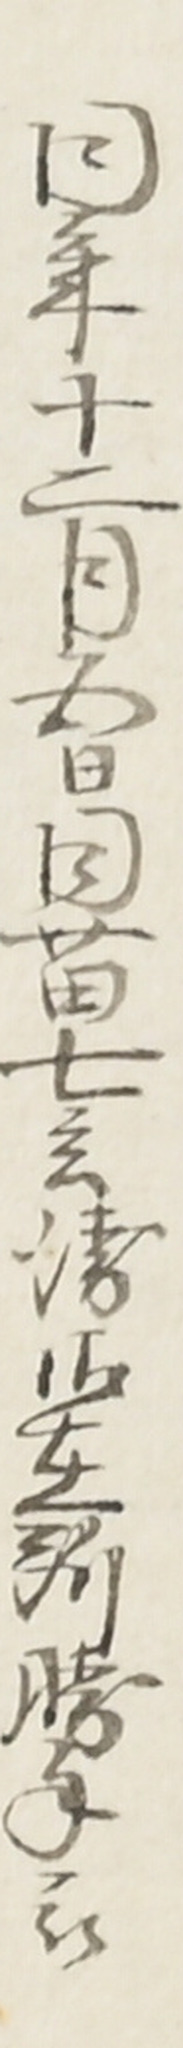一同年十二月五日同苗七兵衛御在所勝手被
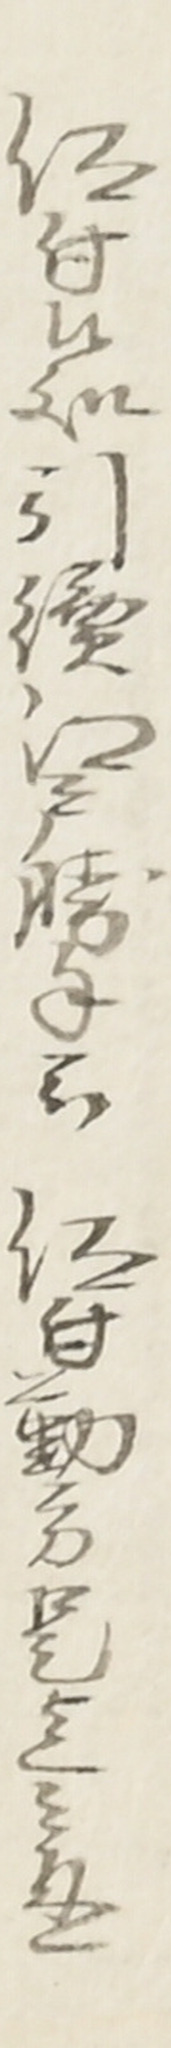仰付候処引續江戸勝手被仰付勤方是迄之通
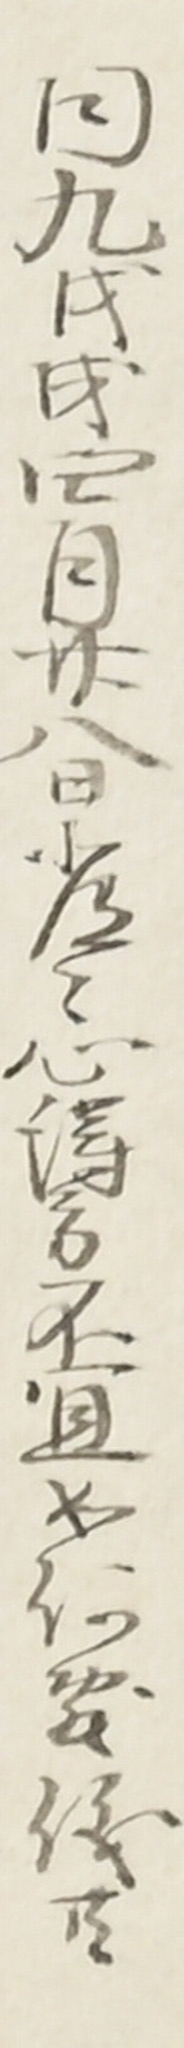一同九戊戌四月廿八日常々心得方不宜如何敷儀共
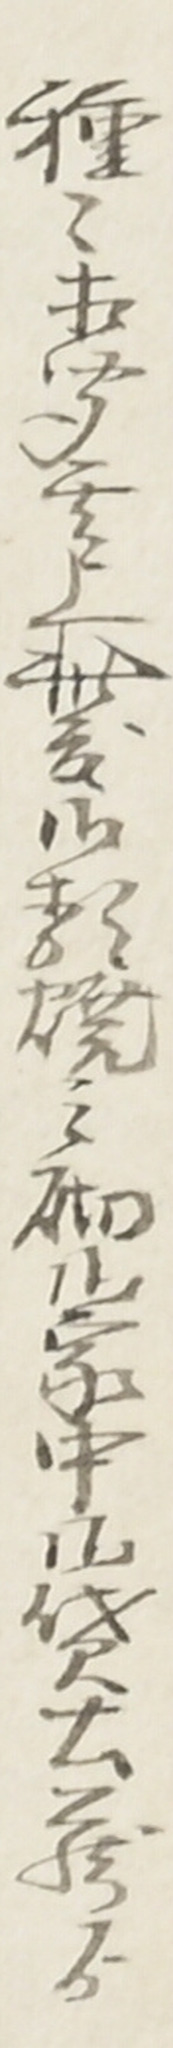種々相聞其上此度御類焼之砌御家中御貸土蔵ゟ
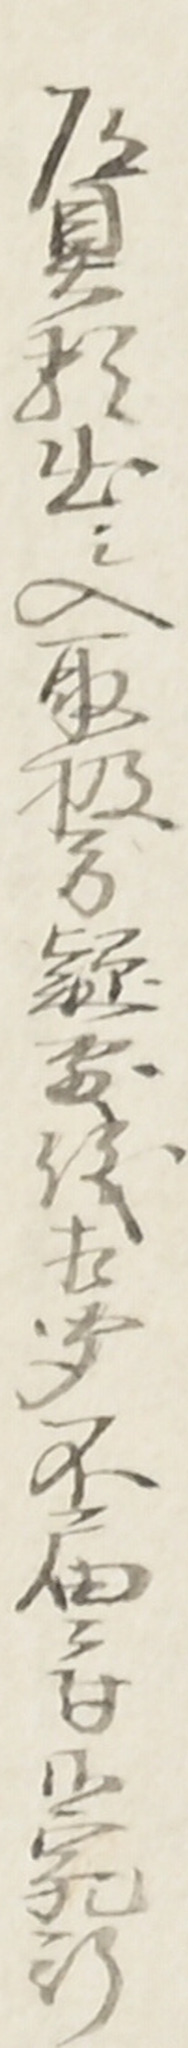道具類出シ入取扱方疑敷儀相聞不届ニ付御宛行
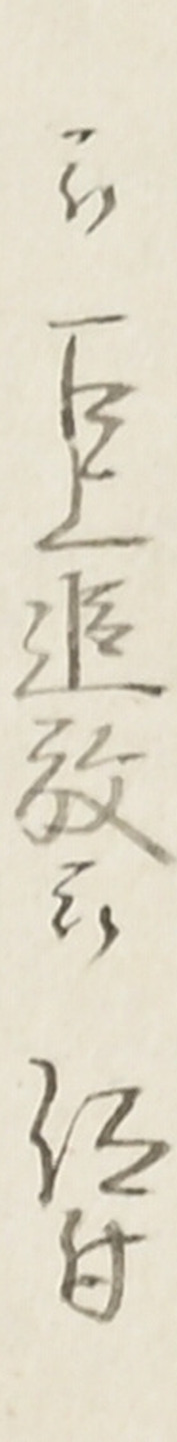被召上追放被仰付
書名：無足諸士勤仕録（四）
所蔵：伊那市立高遠町図書館・合同会社AMANE
